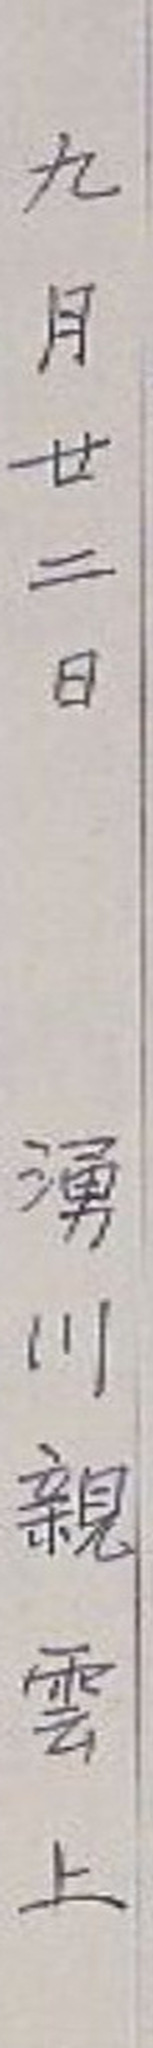九月廿二日湧川親雲上
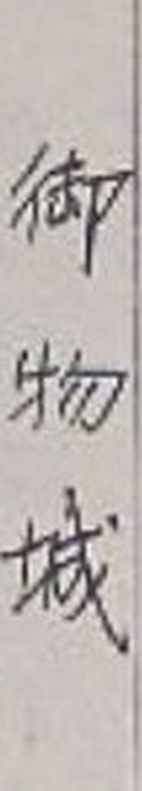御物城
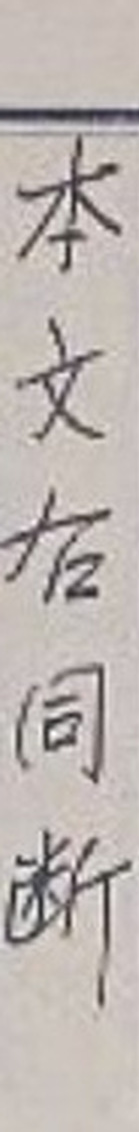本文右同断
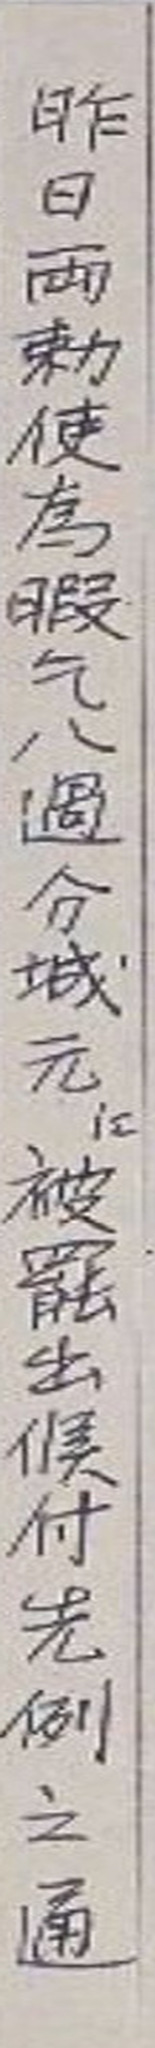昨日両勅使為暇乞八過分城元え被罷出候付先例之通
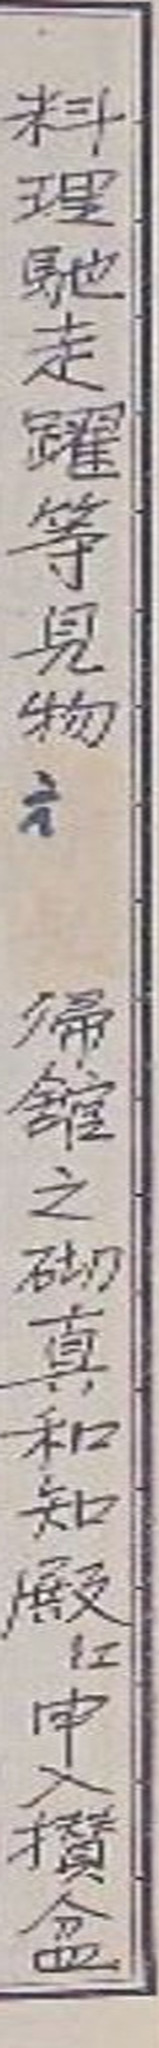料理馳走躍等見物帰館之砌真和知殿え申入攅盆
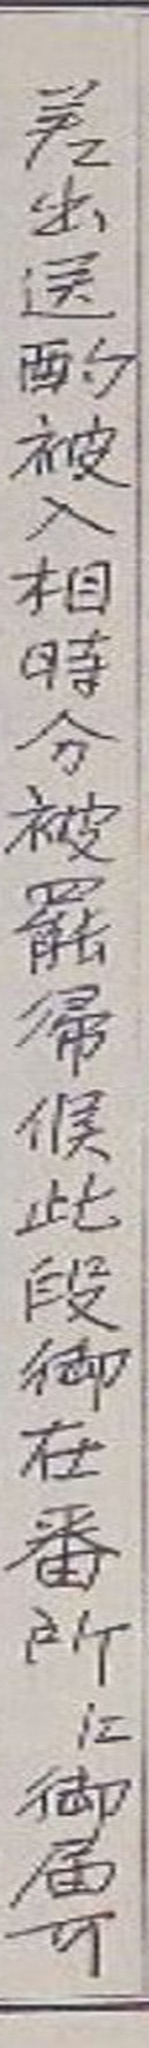差出送酌被入相時分被罷帰候此段御在番所え御届可
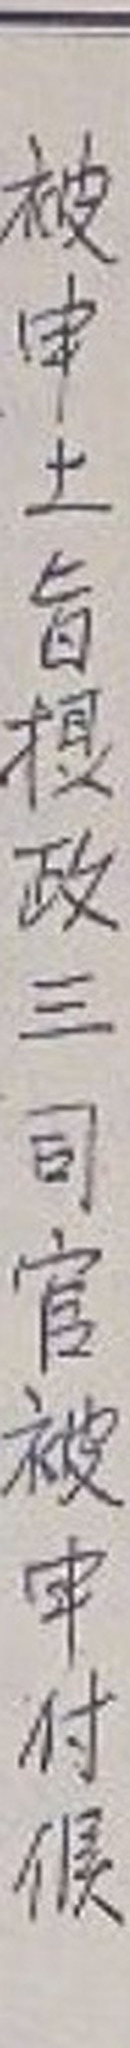被申上旨摂政三司官被申付候
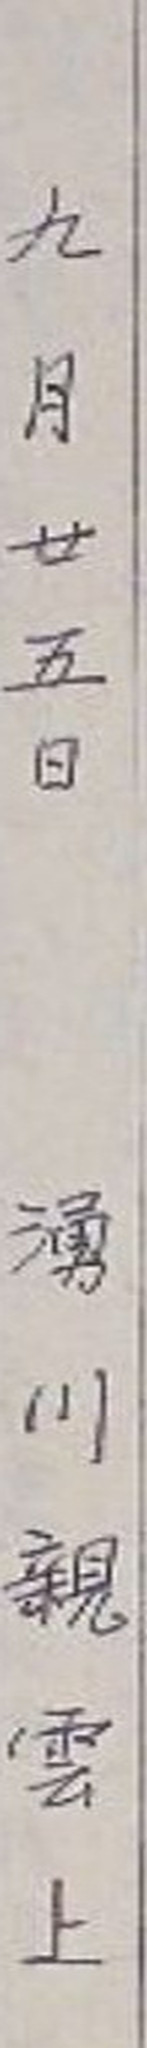九月廿五日湧川親雲上
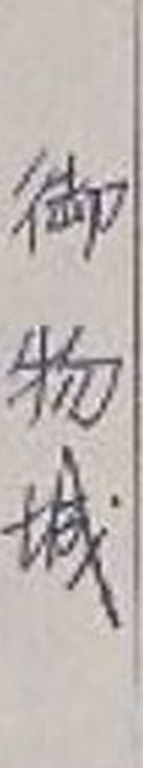御物城
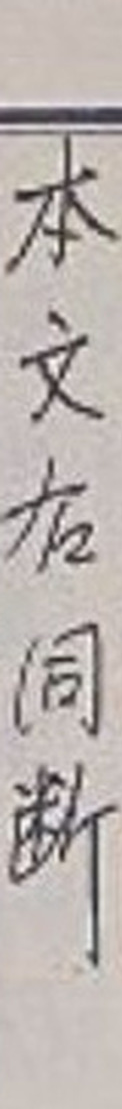本文右同断
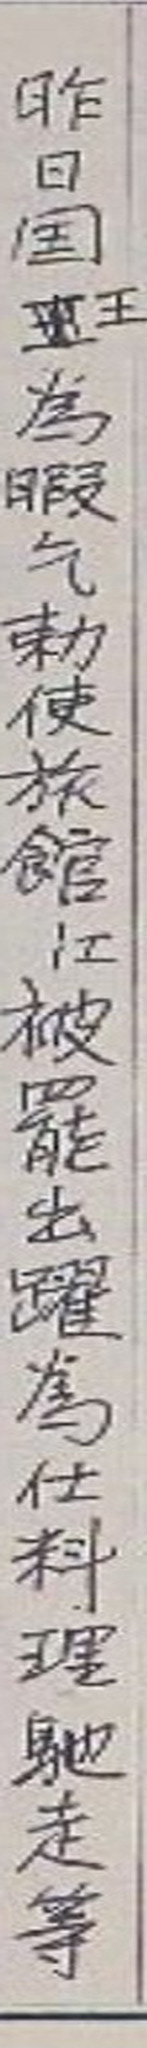昨日国王為暇乞勅使旅館え被罷出躍為仕料理馳走等
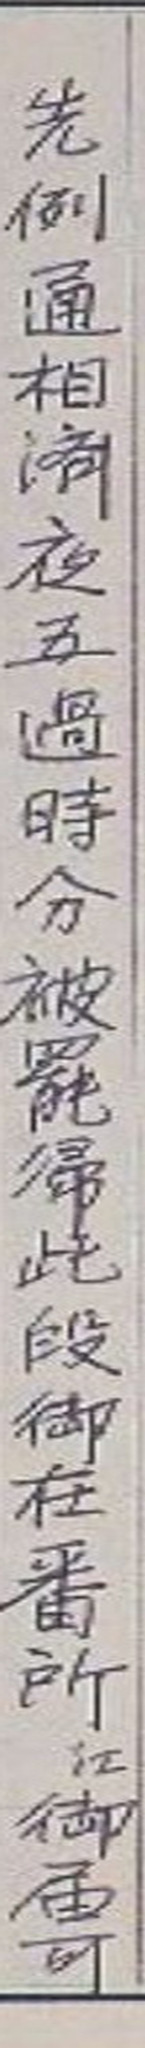先例之通相済夜五過時分被罷帰此段御在番所え御届可
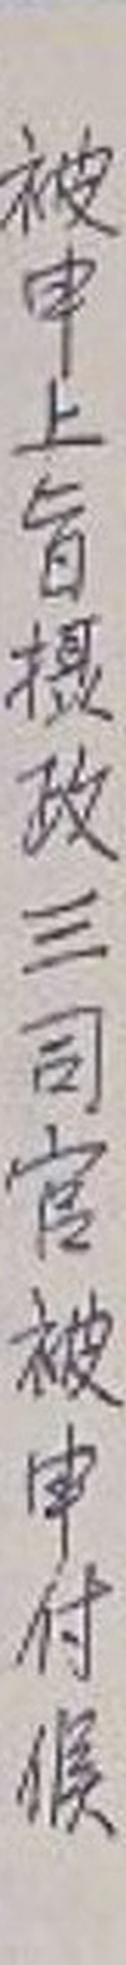被申上旨摂政三司官被申付候
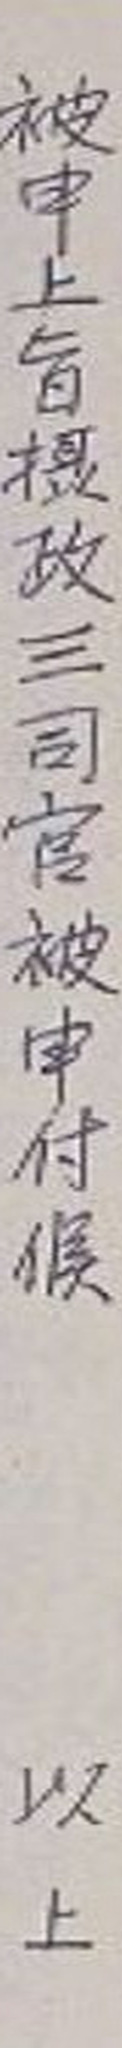被申上旨摂政三司官被申付候以上
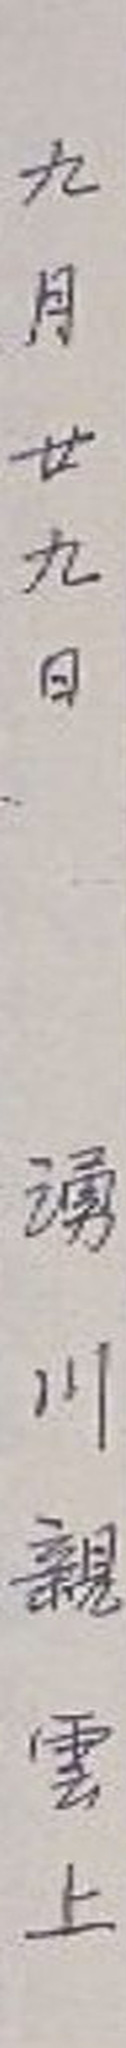九月廿九日湧川親雲上
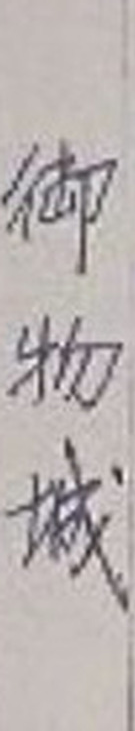御物城
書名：支那冊封使来琉諸記 下巻
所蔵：University of the Ryukyus Library
